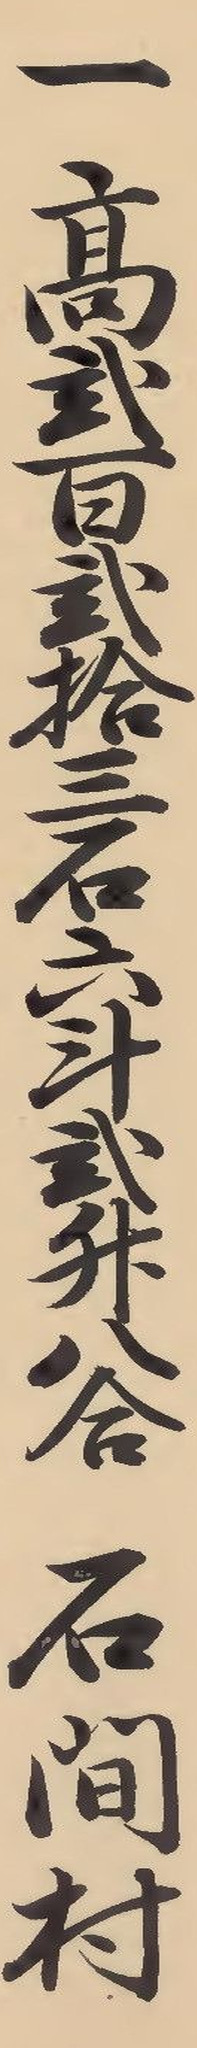一高弐百弐拾三石六斗弐升八合石間村
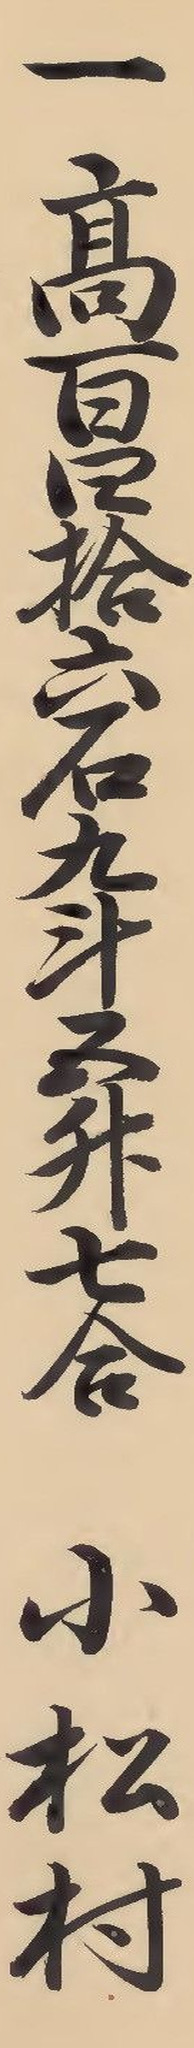一高百四拾六石九斗五升七合小松村
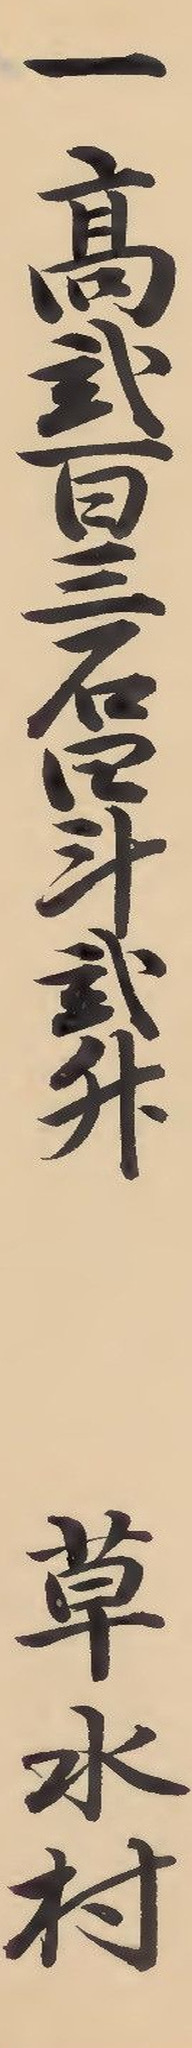一高弐百三石四斗弐升草水村

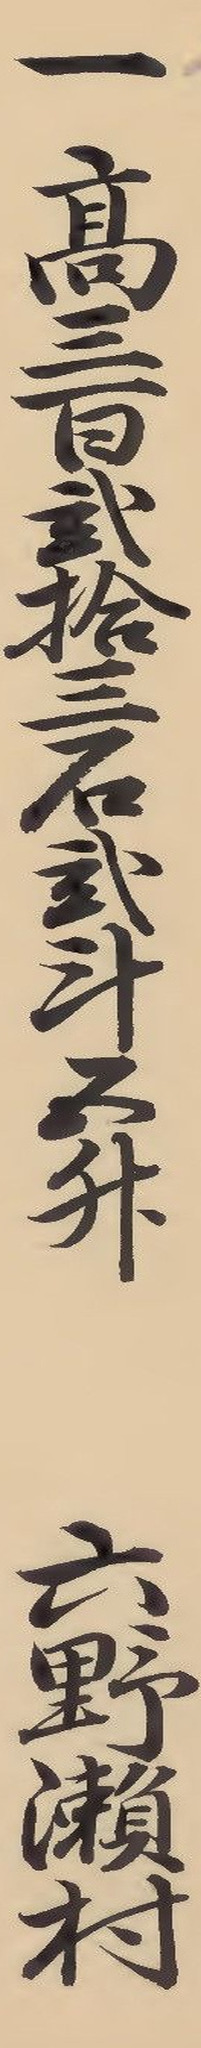一高三百弐拾三石弐斗五升六野瀬村
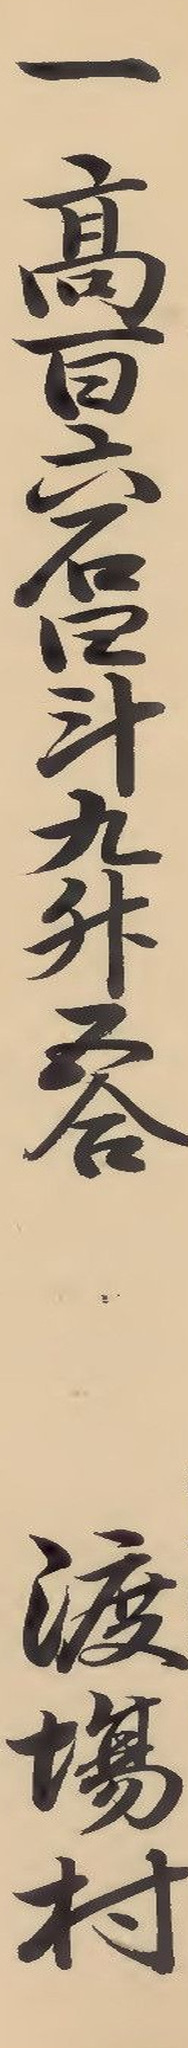一高百六石四斗九升五合渡場村
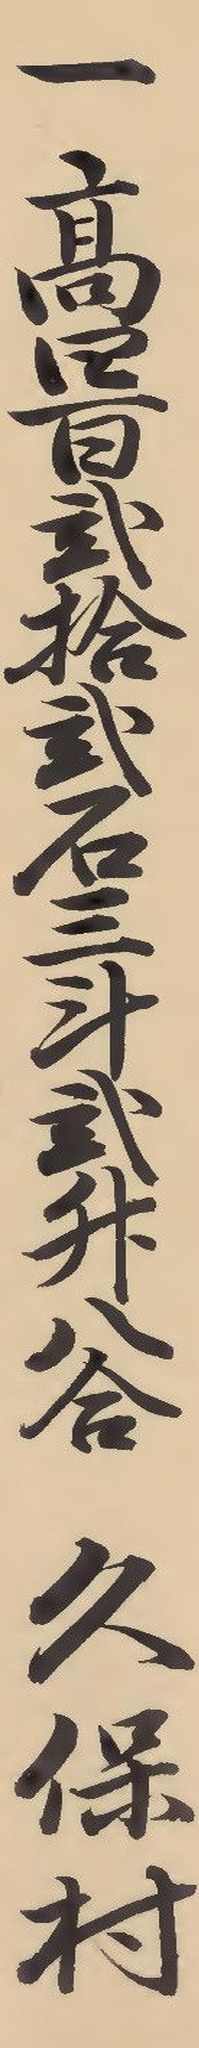一高四百弐拾弐石三斗弐升八合久保村
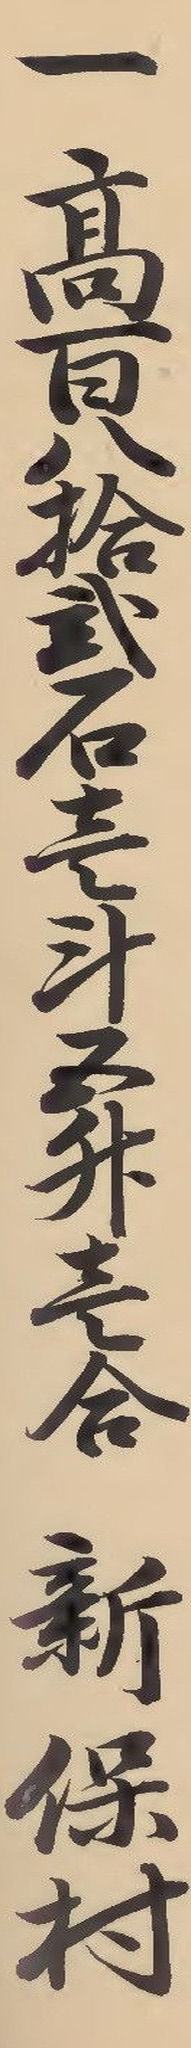一高百八拾弐石壱斗五升壱合新保村
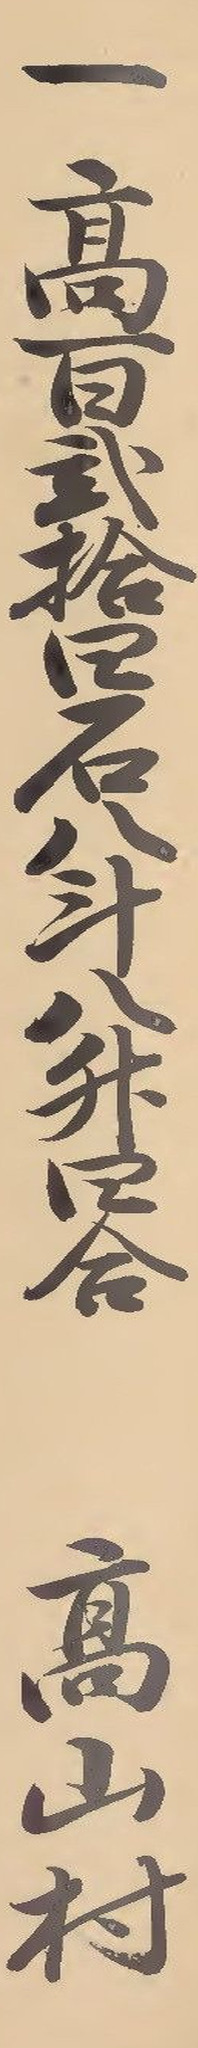一高百弐拾四石八斗八升四合高山村
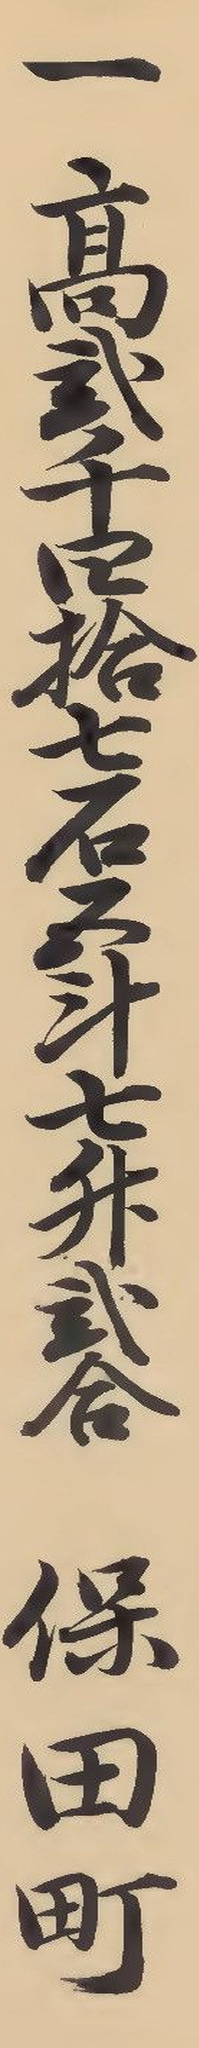一高弐千四拾七石五斗七升弐合保田町
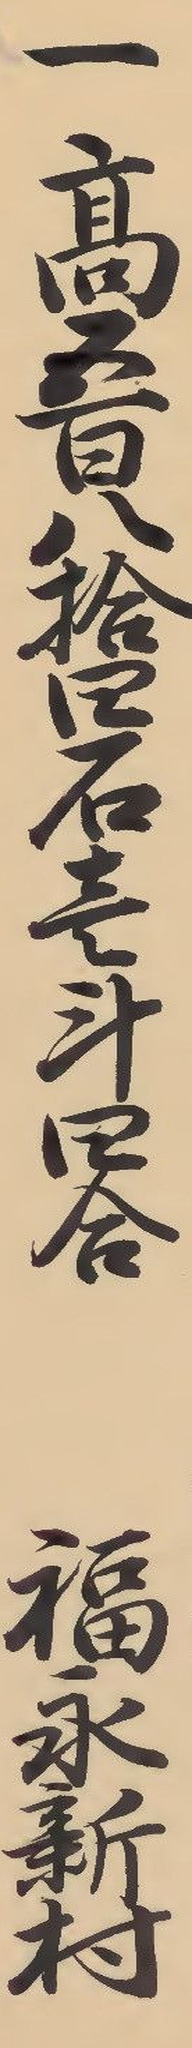一高五百八拾四石壱斗四合福永新村

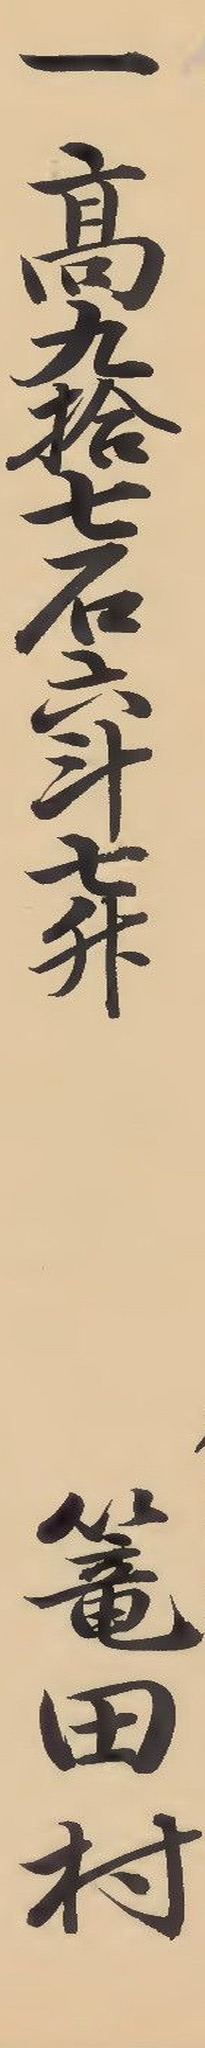一高九拾七石六斗七升篭田村
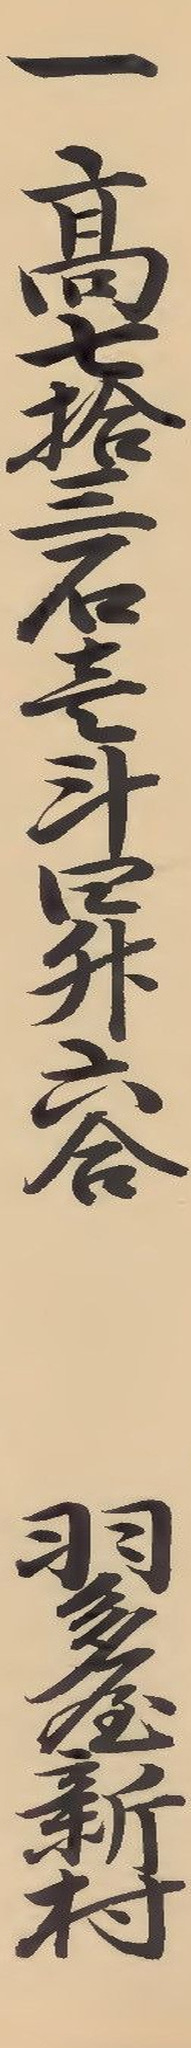一高七拾三石壱斗四升六合羽多屋新村
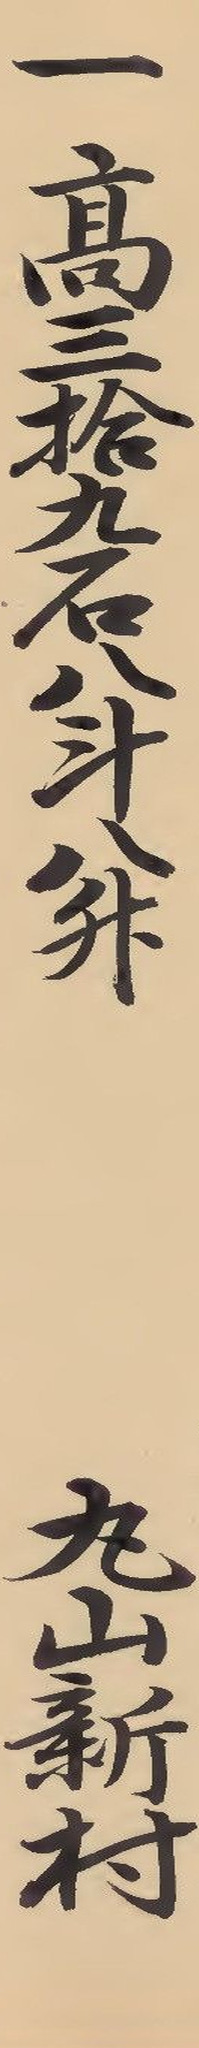一高三拾九石八斗八升丸山新村
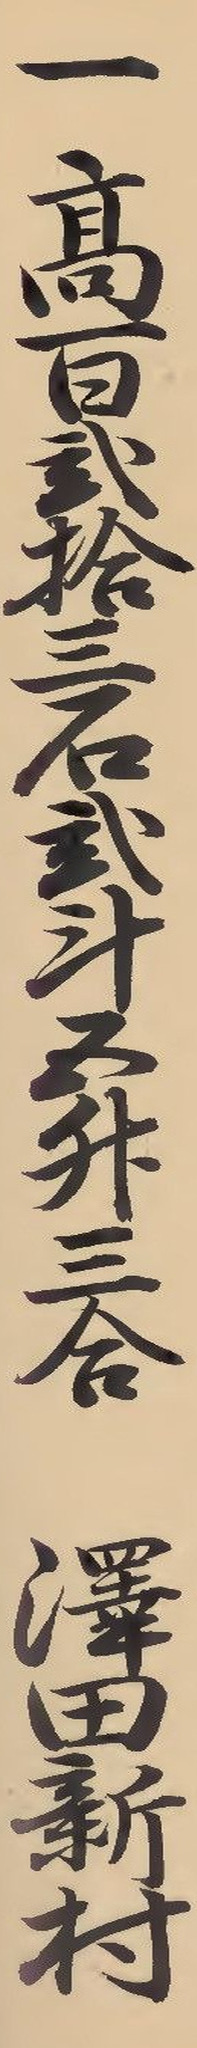一高百弐拾三石弐斗五升三合沢田新村
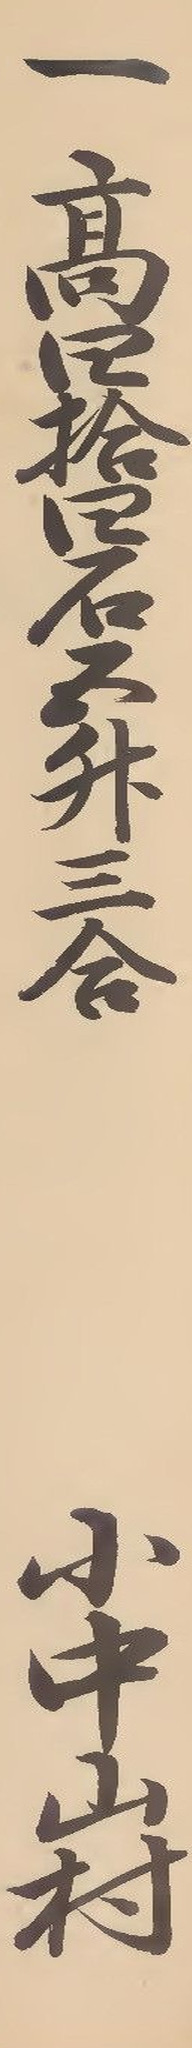一高四拾四石五升三合小中山村
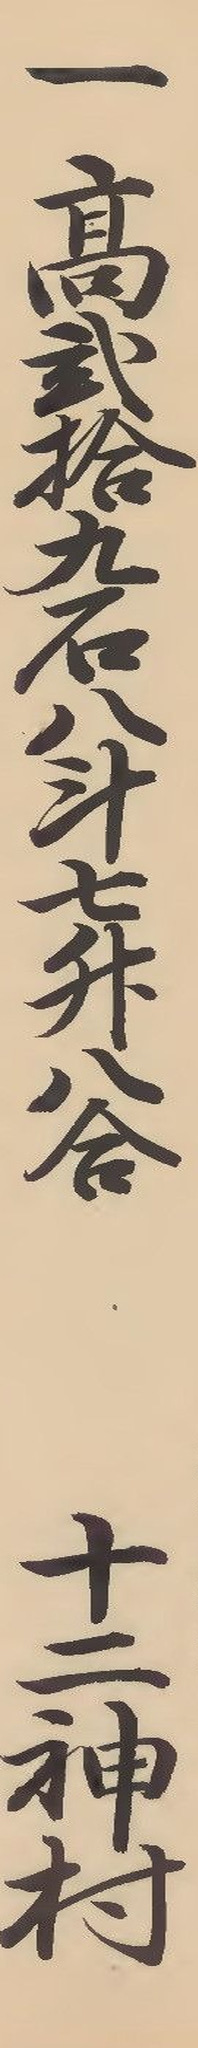一高弐拾九石八斗七升八合十二神村
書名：越後国郷帳　下
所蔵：国立公文書館 National Archives of Japan
